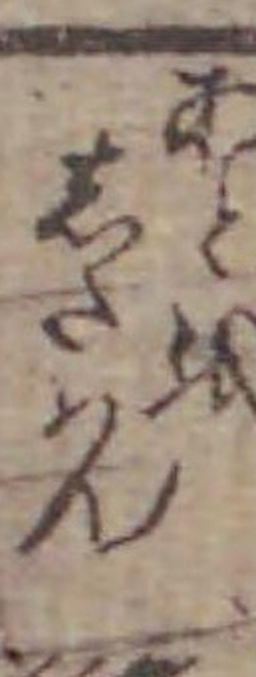したはん
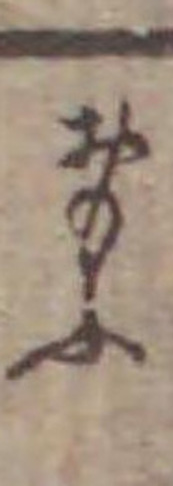おもふ

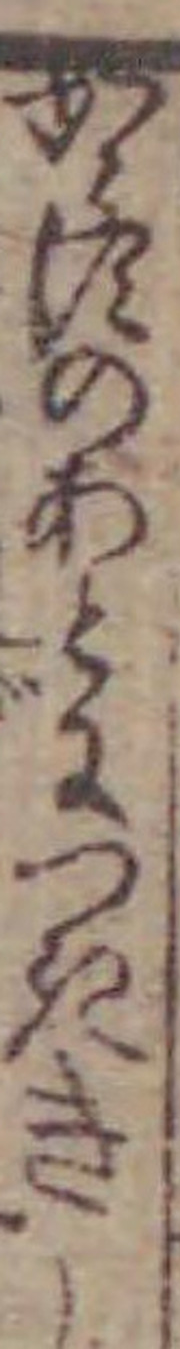からすのあとにつき
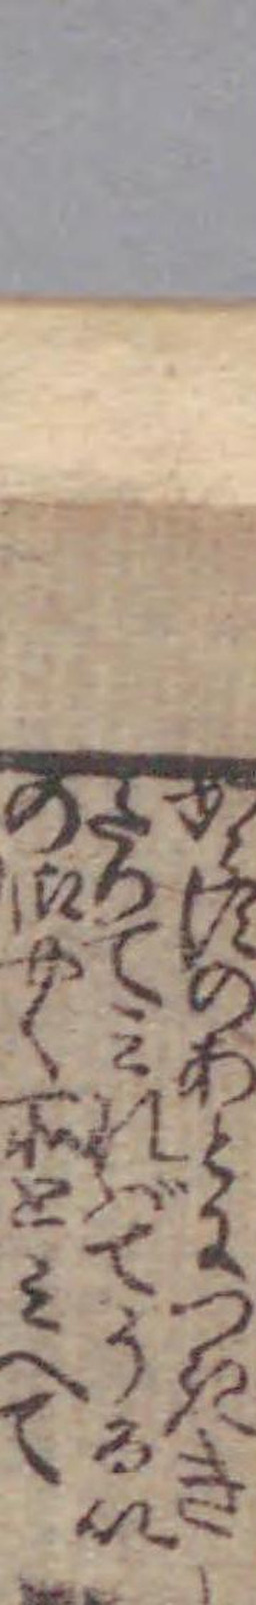きたりてみればてうるい
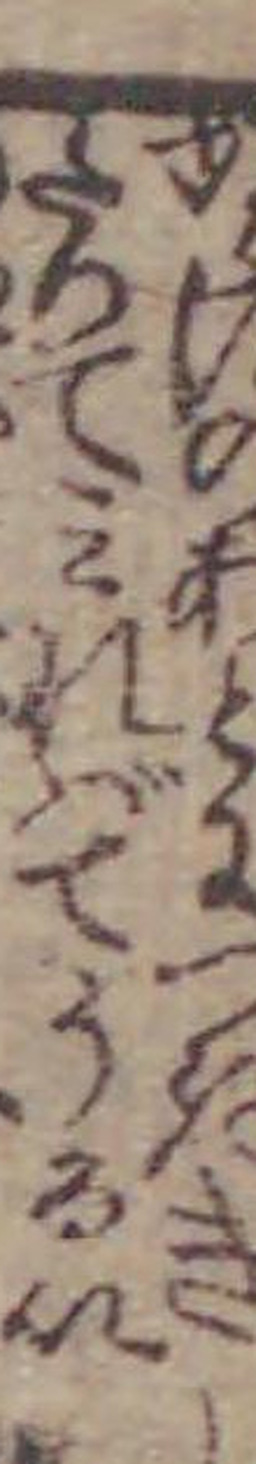きたりてみればてうるい
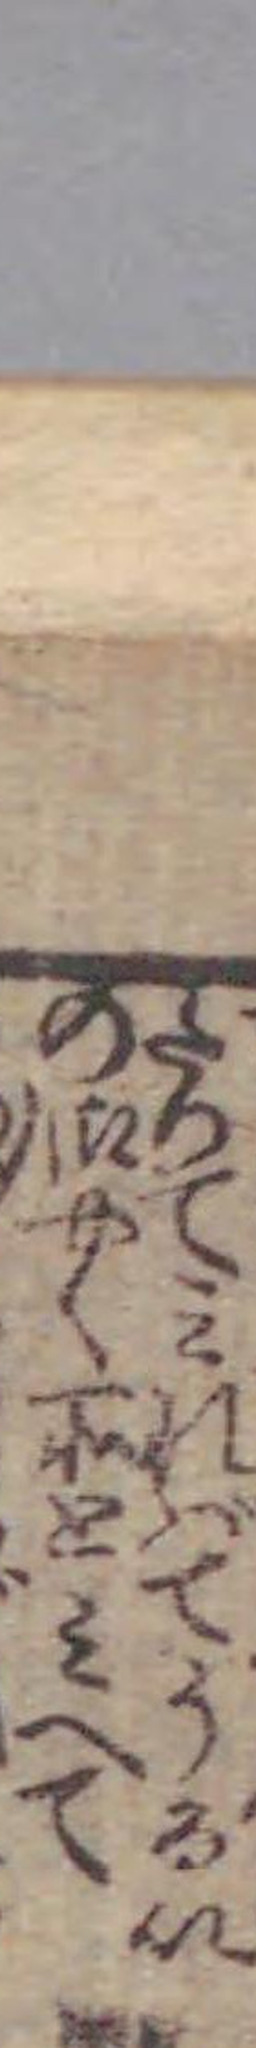の御やく所とみへて
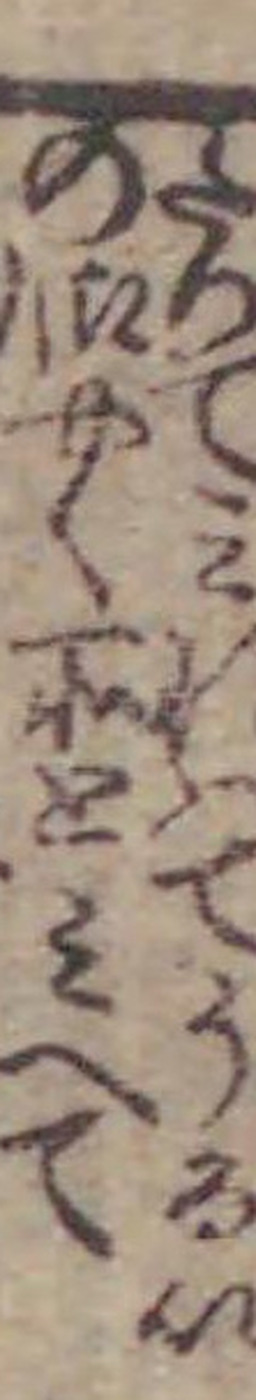の御やく所とみへて
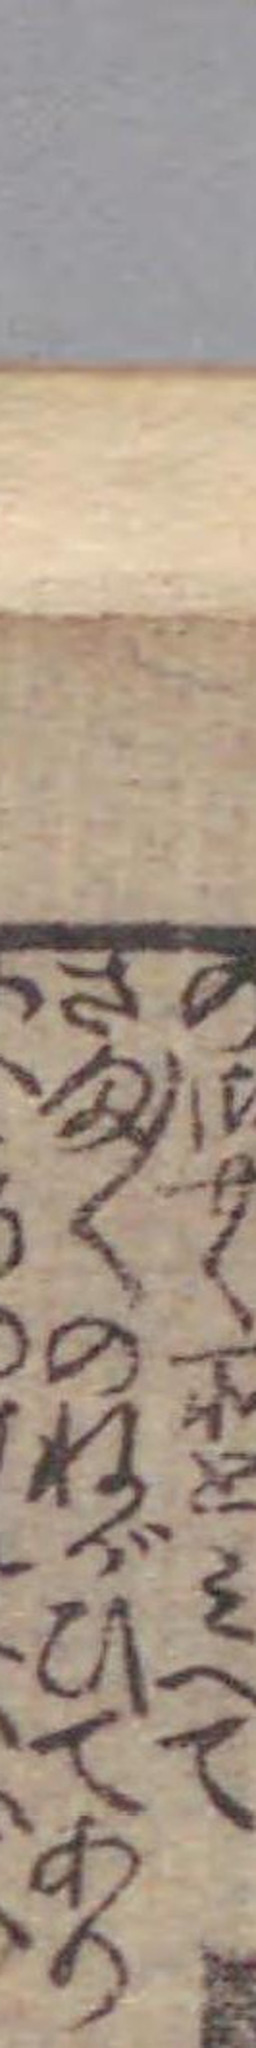さま〳〵のねがひてあり
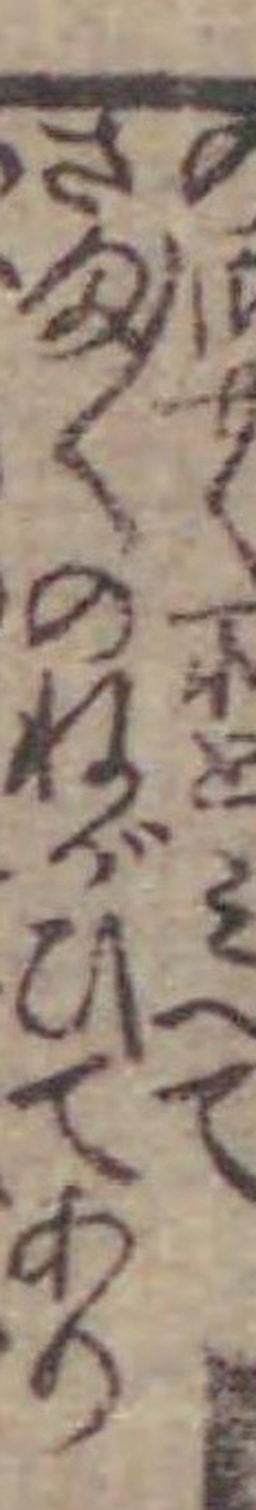さま〳〵のねがひてあり
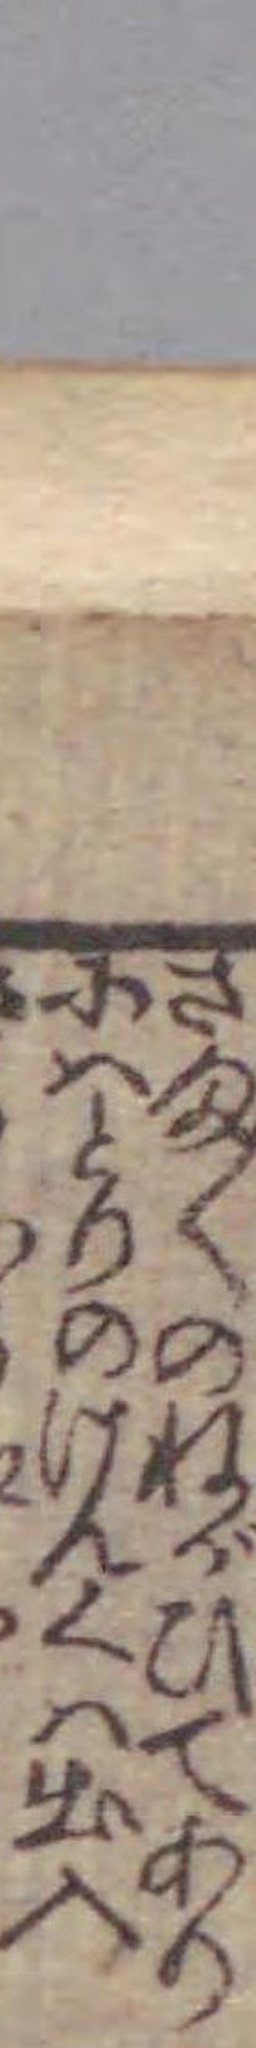にはとりのけんくは出入
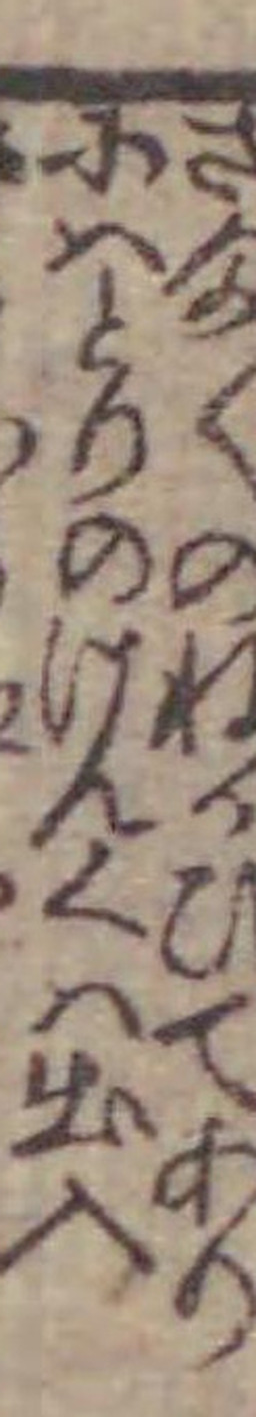にはとりのけんくは出入
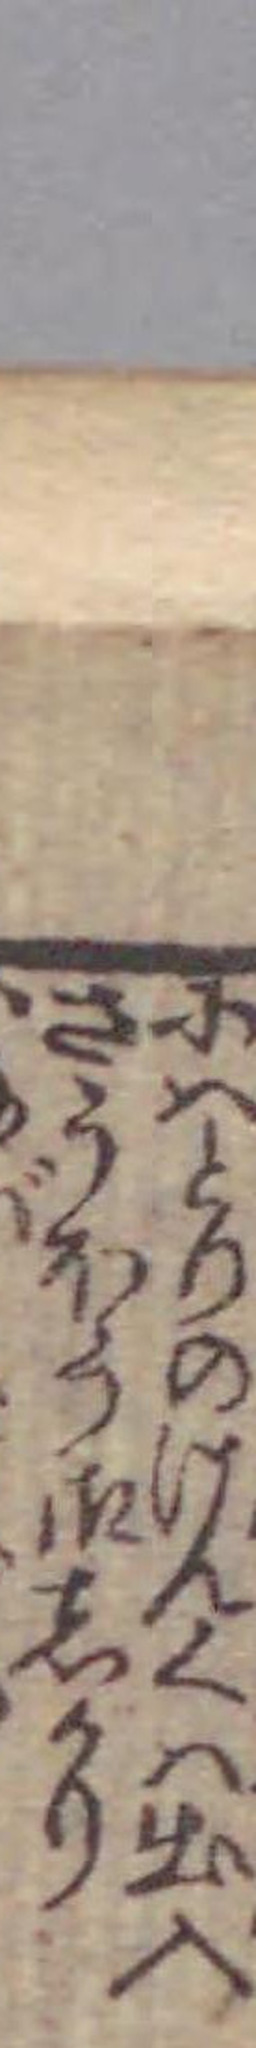さうほう御しかり
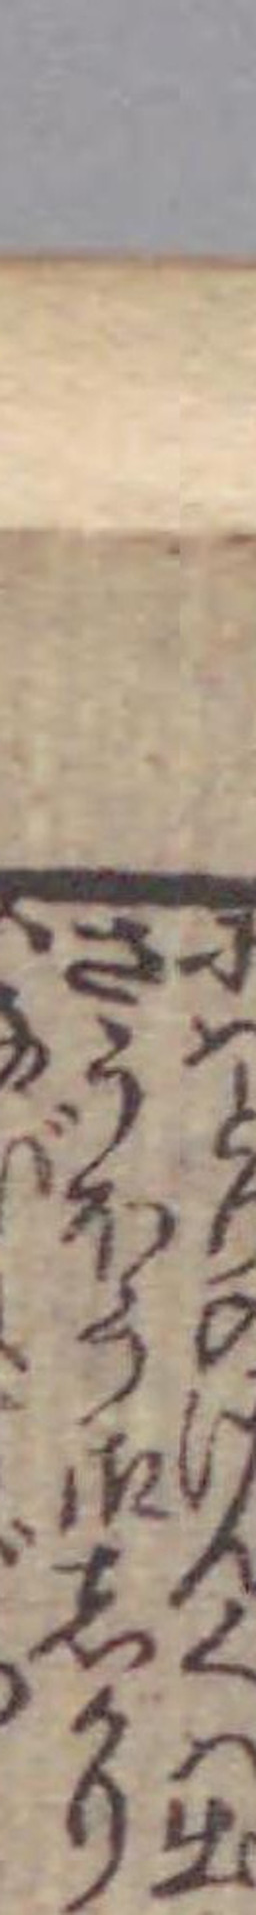さうほう御しかり
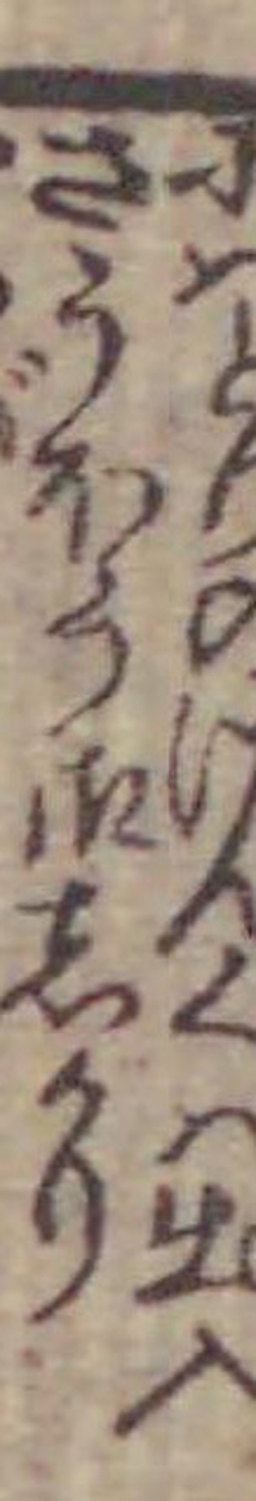さうほう御しかり
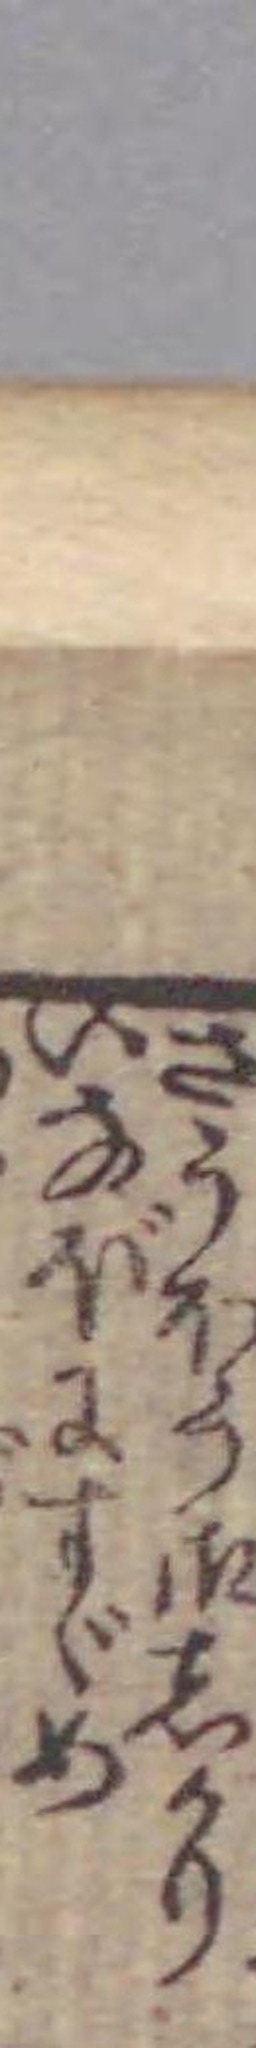いなぼにすゞめ
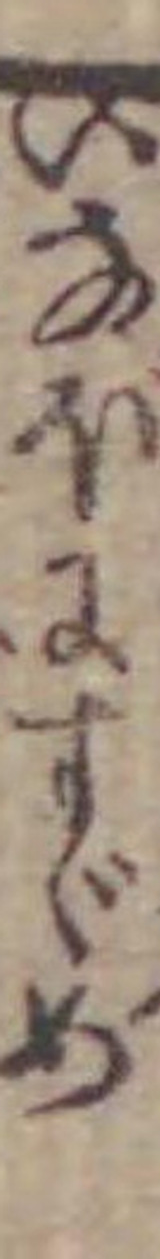いなぼにすゞめ
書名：即席耳学問 : 3巻
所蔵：国立国会図書館 National Diet Library, JAPAN
